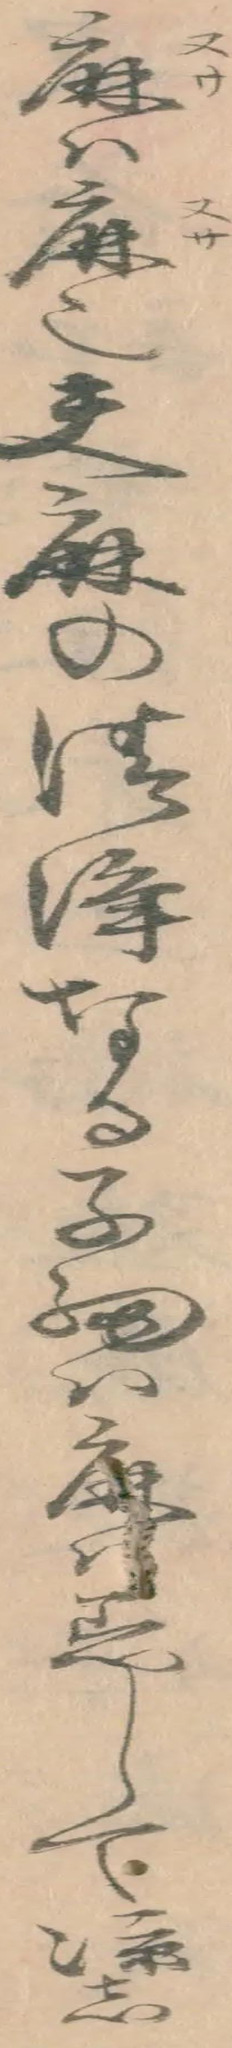麻は麻也夫麻の清浄なる子細は麻は着して涼し
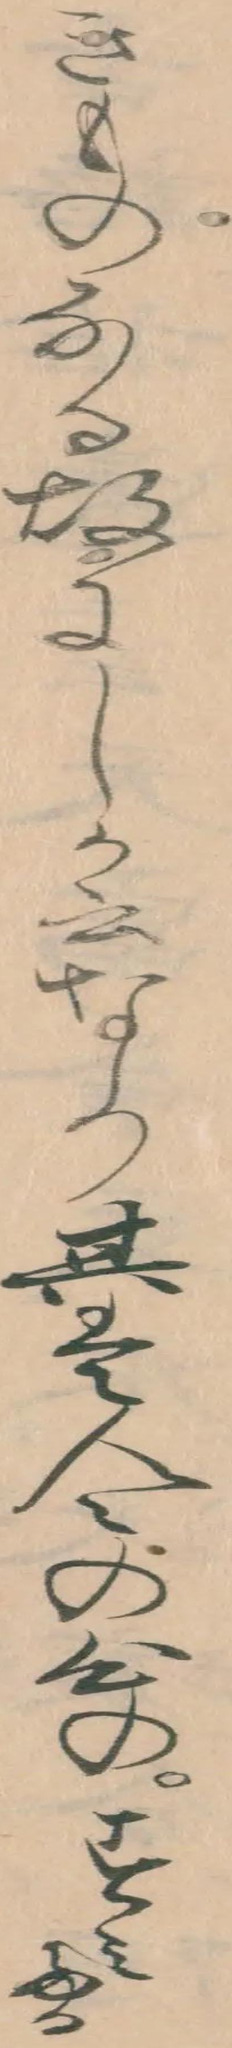きものなる故にしか云なり其は人々の心の。すみたる
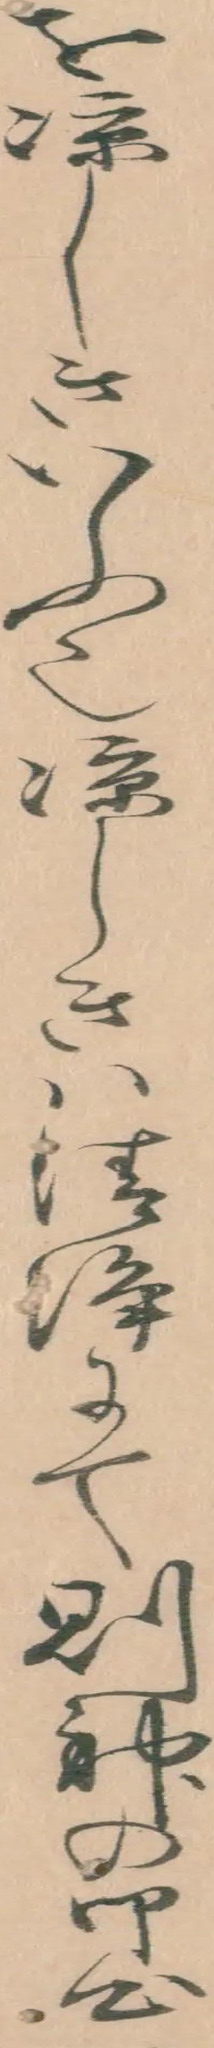を涼しきいふ也凉しきは清浄にて則神の御心
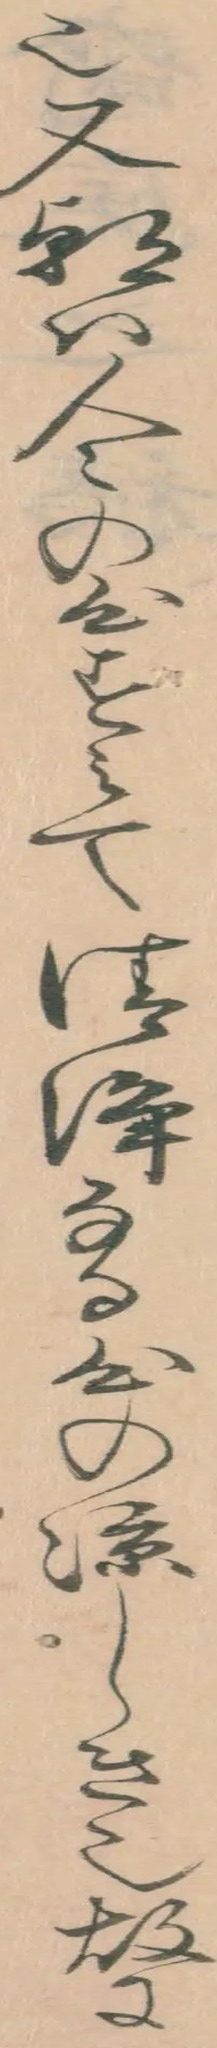也又朝は人々の心すみて清浄なる心の涼しき也故に
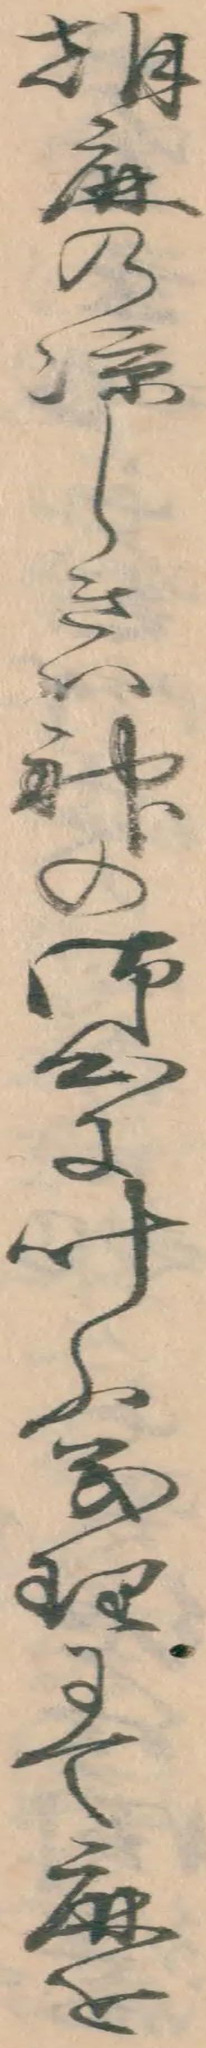朝麻の涼しきは神の御心に叶ふ義理にて麻を
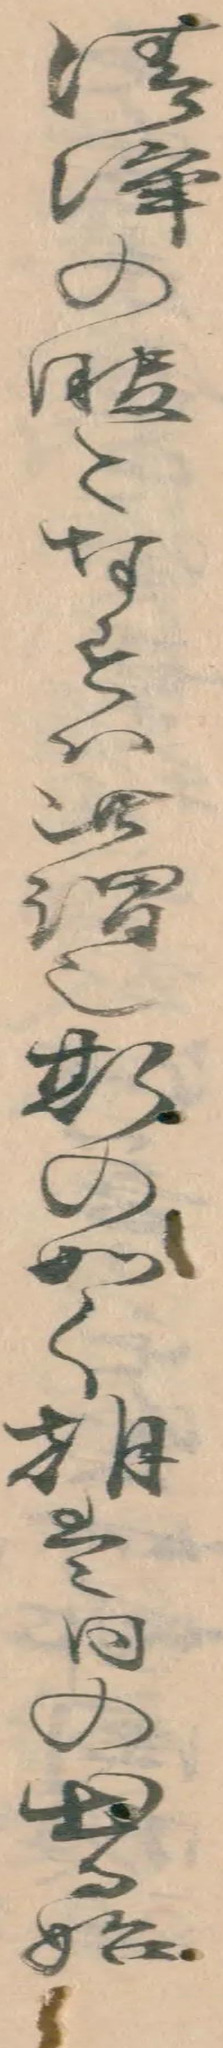清浄の服となすは此謂也斯の如く朝は日の出る始
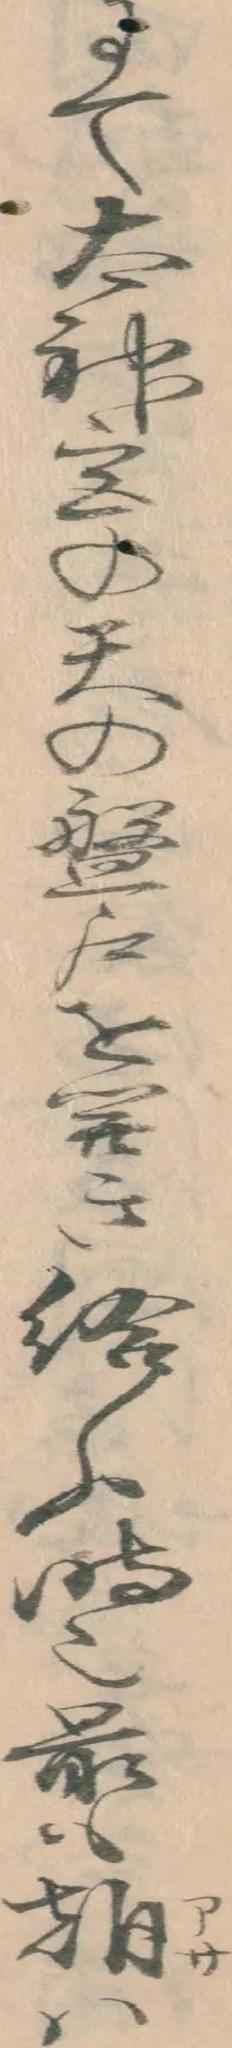にて太神宮の天の盤戸を開き給ふ時也最も朝は
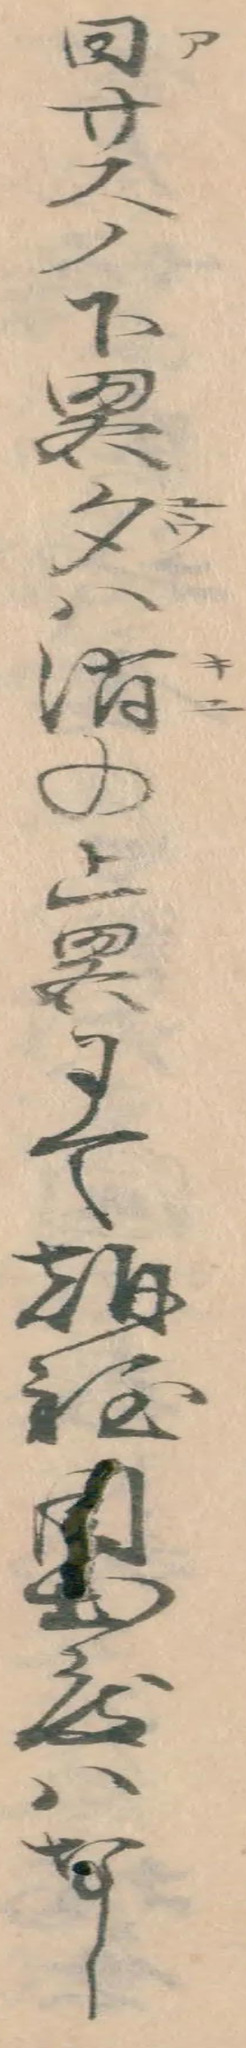日サスノ下略夕は消の上略にて朝程目出度はなし
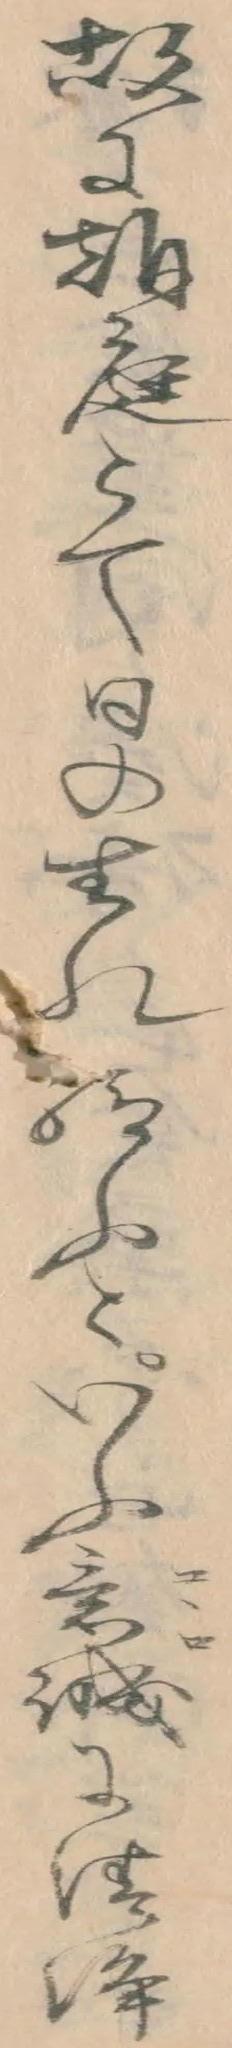故に朝庭とて日の生れ給ふと。いふ意識に清浄
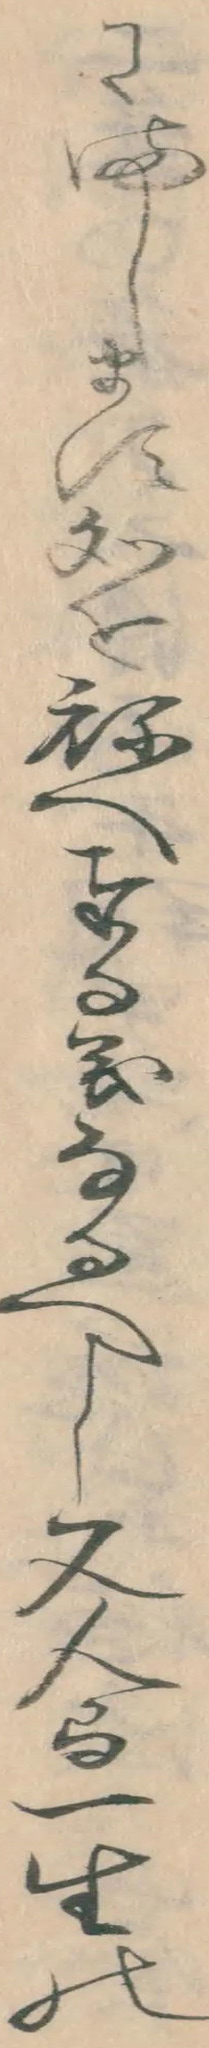にまします処を祢へ奉る義なるへし又人間一生の
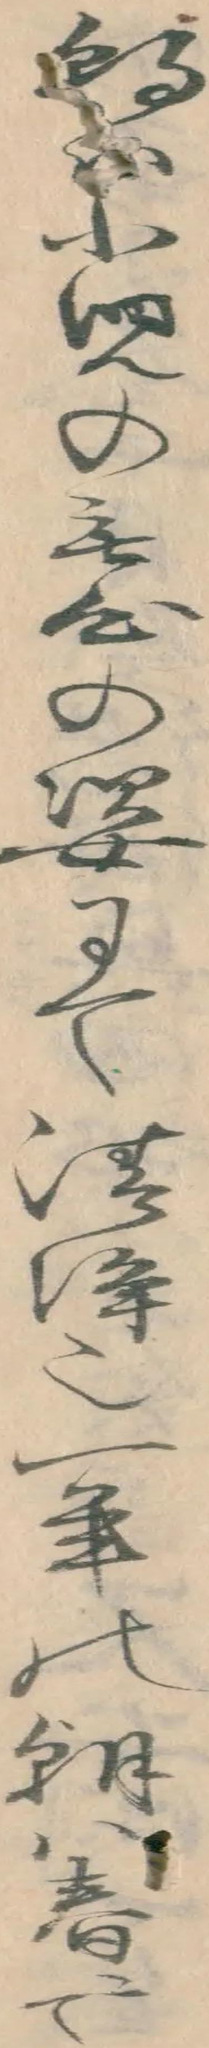朝は小児の無心の姿にて清浄也一年の朝は春にて
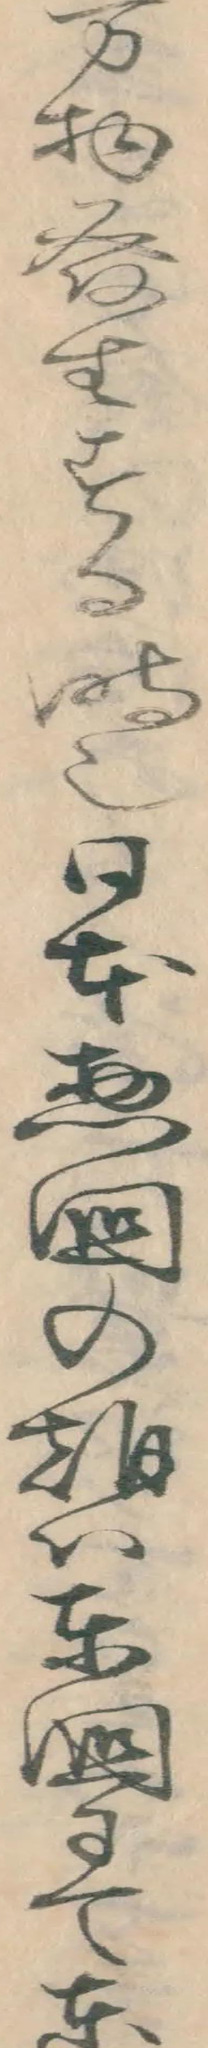万物発生する時也日本惣国の朝は東国にて東
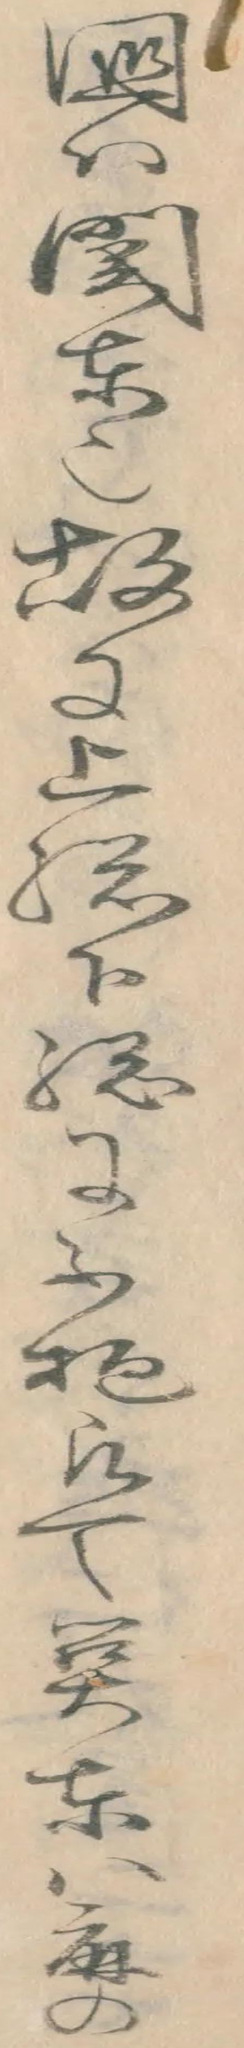国は関東也故に上総下総に不抱凡て関東は麻の
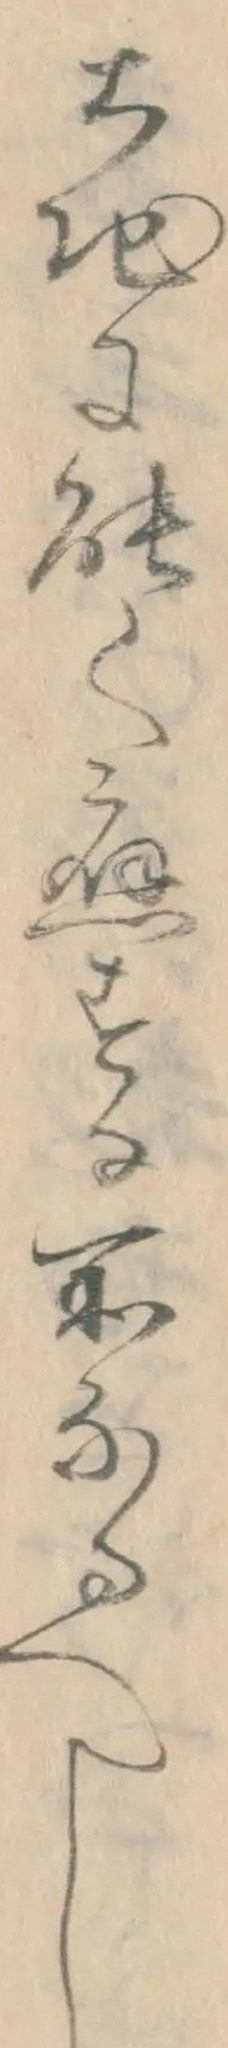大地に能く応する所なるへし

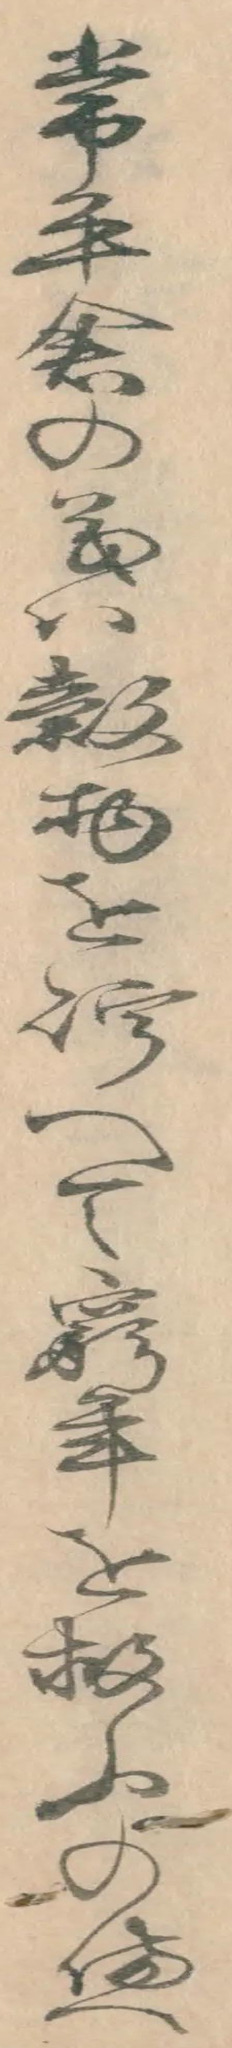一常平倉の義は穀物を貯へて窮年を救ふの備へ
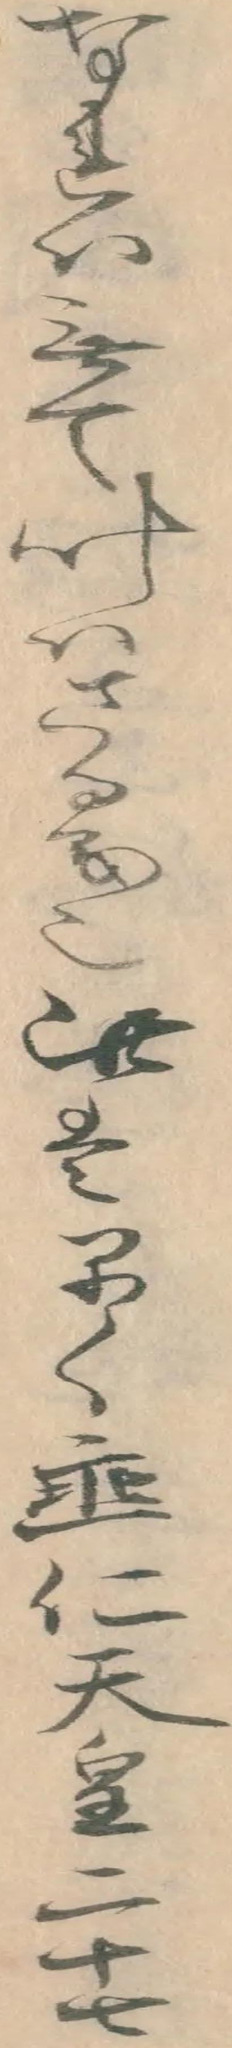なれは無て叶はさる義也此は早く垂仁天皇二十七
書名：斎庭之穂
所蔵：国立国会図書館 National Diet Library, JAPAN
